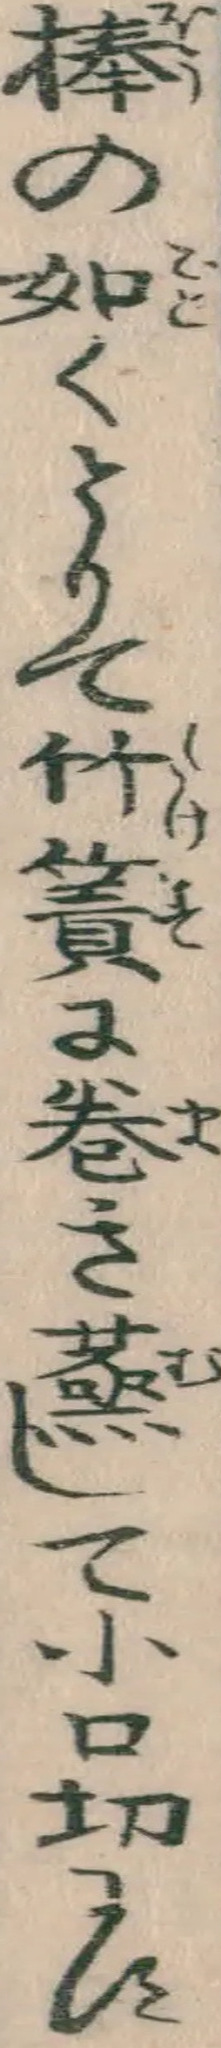棒の如くとりて竹簀に巻き蒸して小口切にす
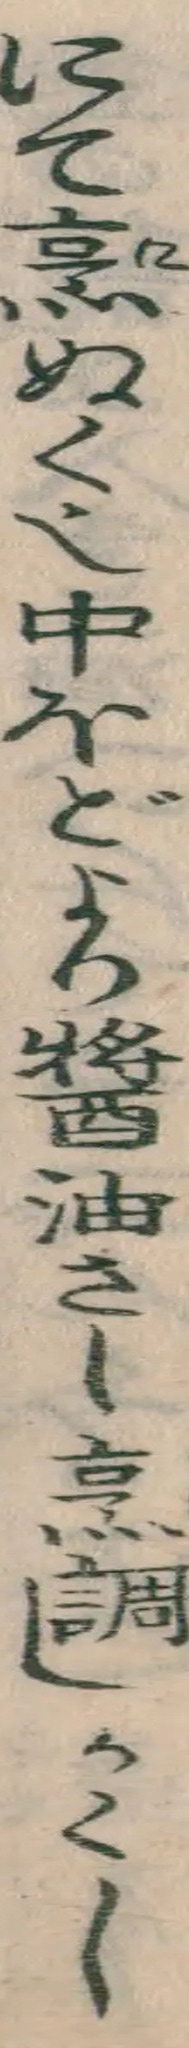にて烹ぬく也中ほどより醤油さし烹調しかくし
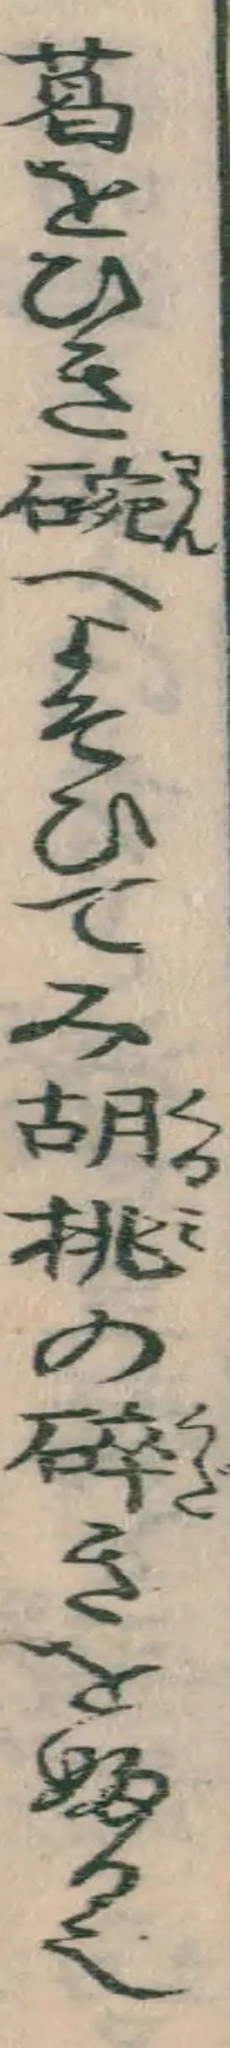葛をひき碗へよそひてみ胡桃の碎きをふる也

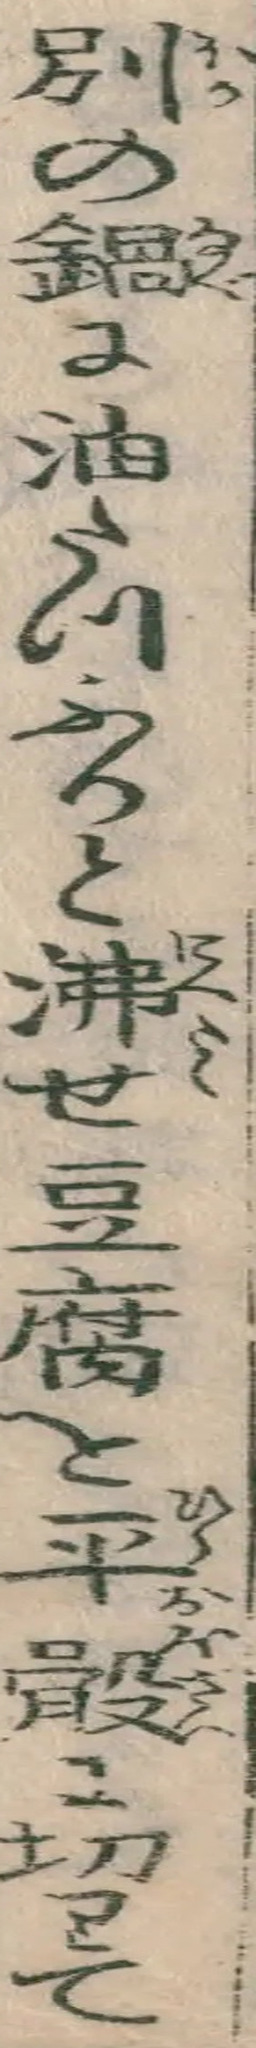別の鍋に油たつふりと沸せ豆腐を平骰に切りて
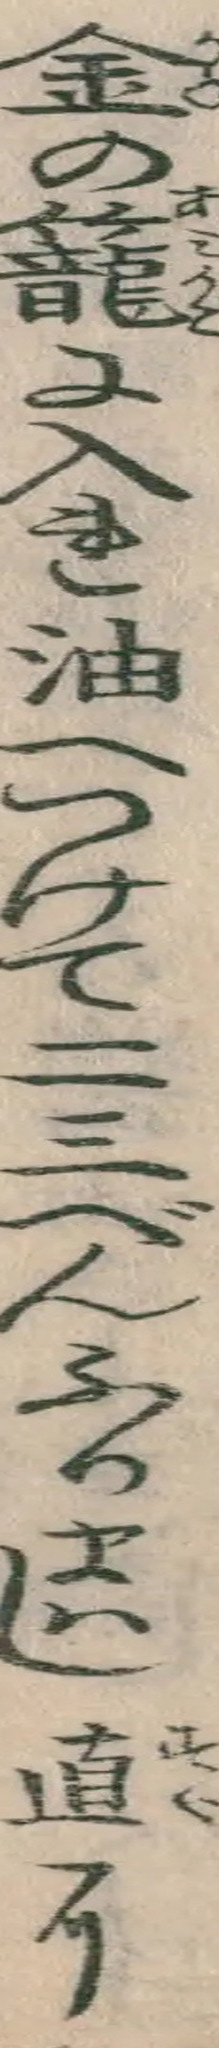金の籠に入れ油へつけて二三べんふりまはし直に
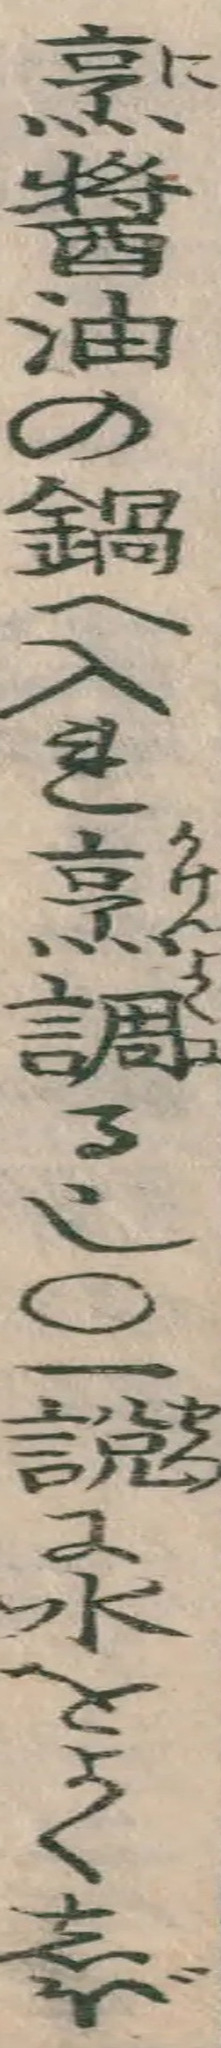烹醤油の鍋へ入れ烹調る也○一説に水をよくしぼ
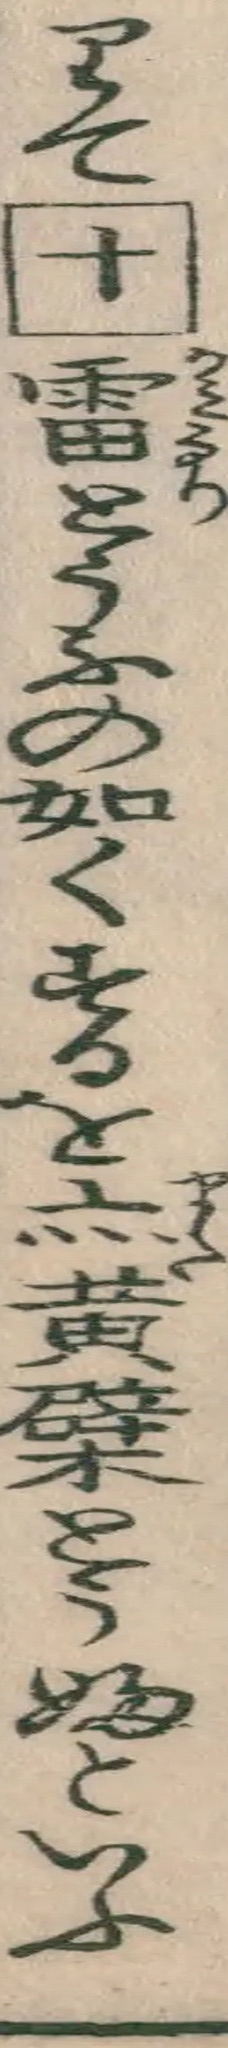りて[十]雷とうふの如くするを亦黄檗とうふといふ
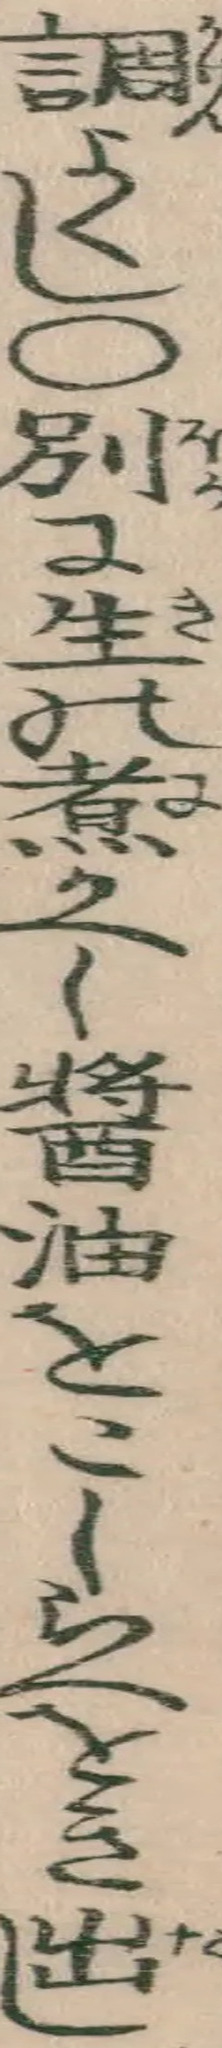調よくし○別に生の煮かへし醤油をこしらへをき出し
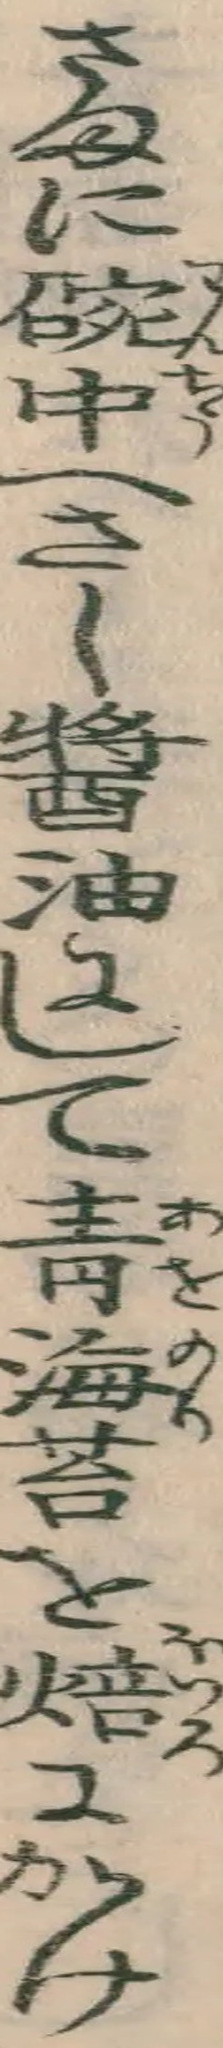さまに碗中へさし醤油にして靑海苔を焙にかけ
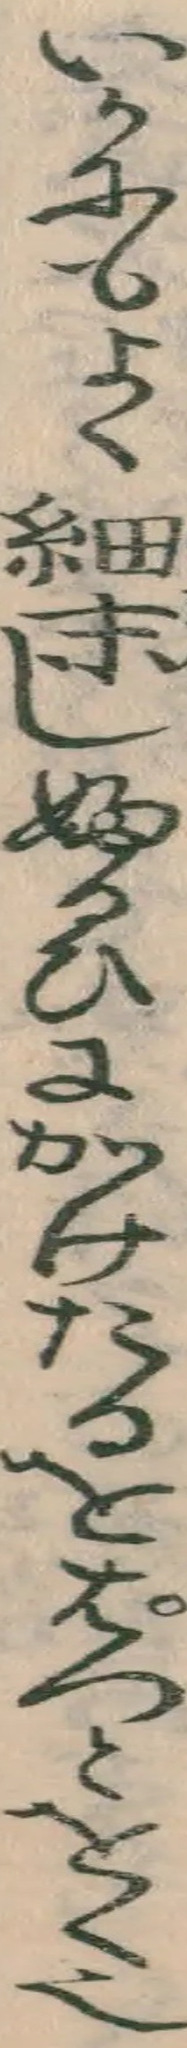いかにもよく細末しふるひにかけたるをぱつとをく也
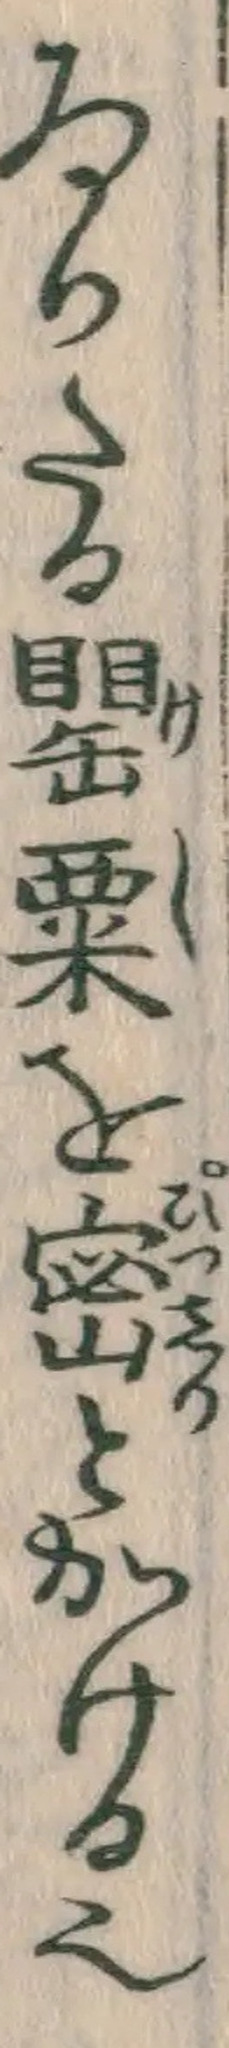ゐりたる罌粟を密とかける也
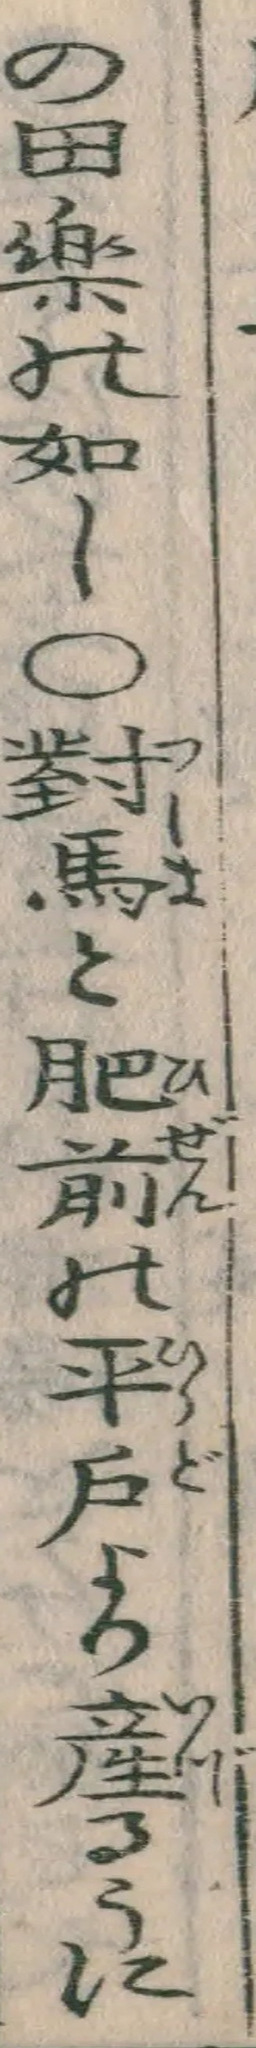の田樂の如し○對馬と肥前の平戸より産るうに
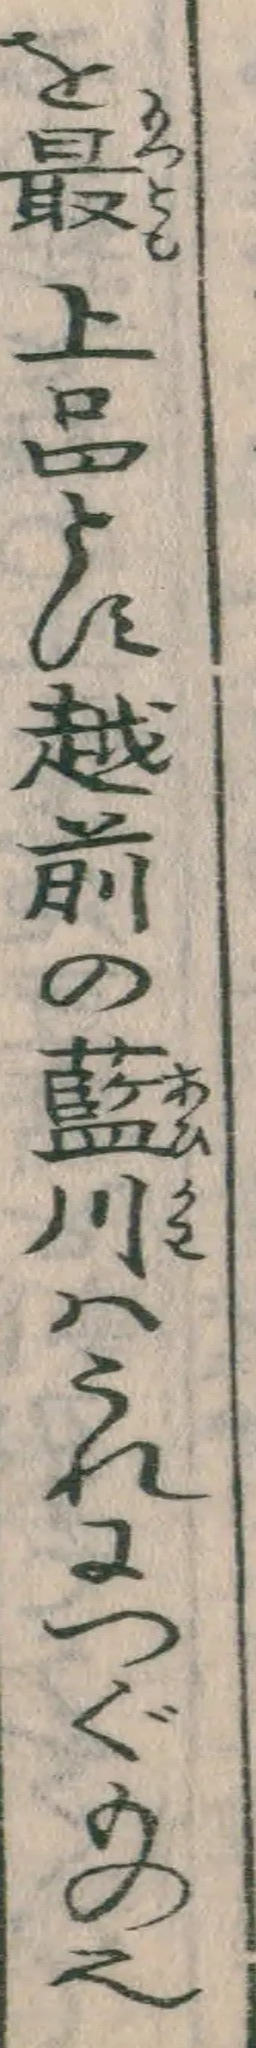を最上品とす越前の藍川はこれにつぐもの也
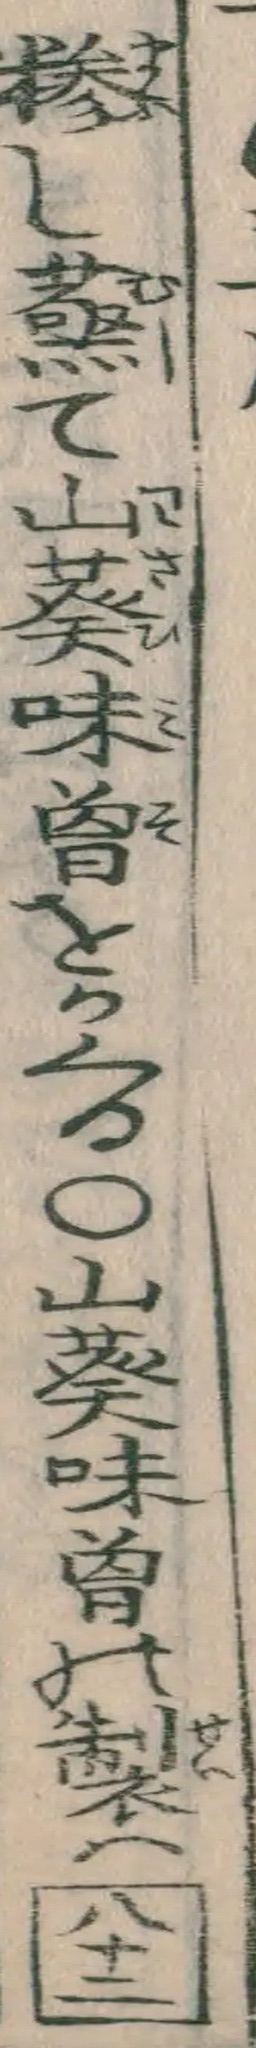糝し蒸て山葵味曽をかくる○山葵味曽の製は[八十二]

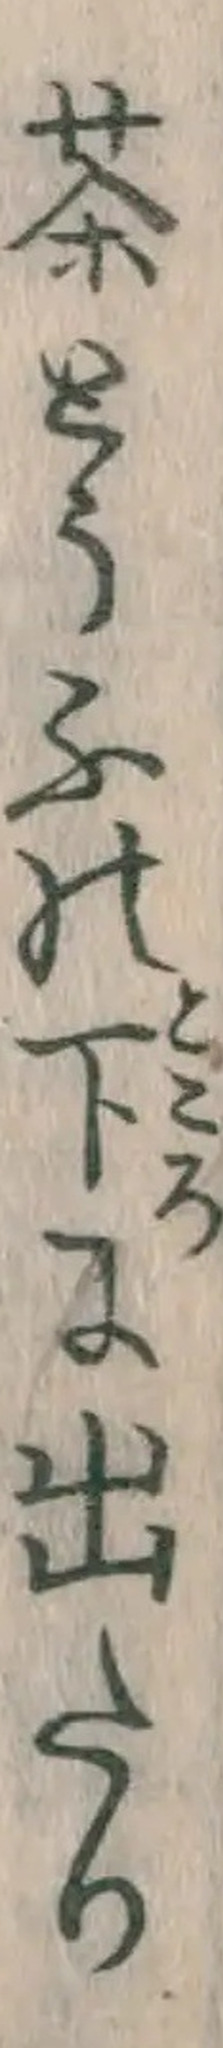茶とうふの下に出たり
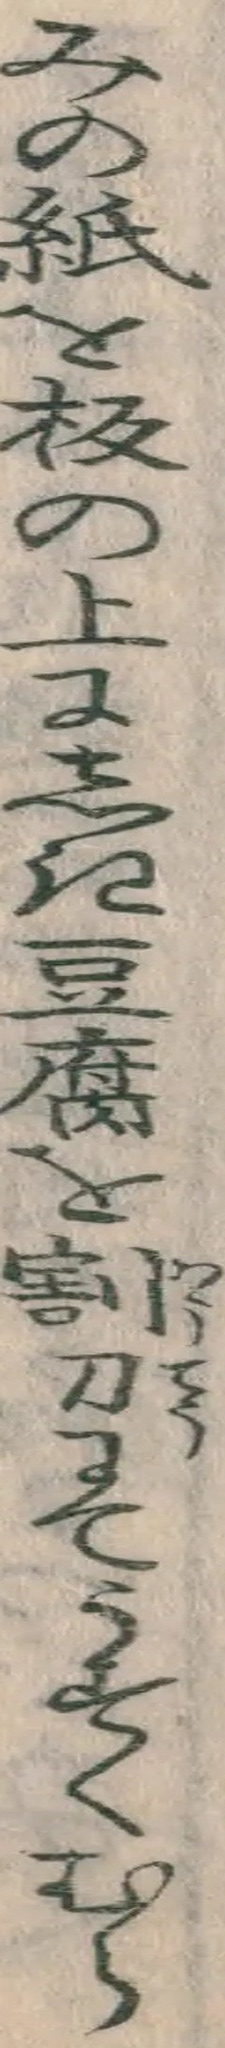みの紙を板の上にしき豆腐を割刀にてうすくむら
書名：豆腐百珍. [正編]
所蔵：国立国会図書館 National Diet Library, JAPAN
